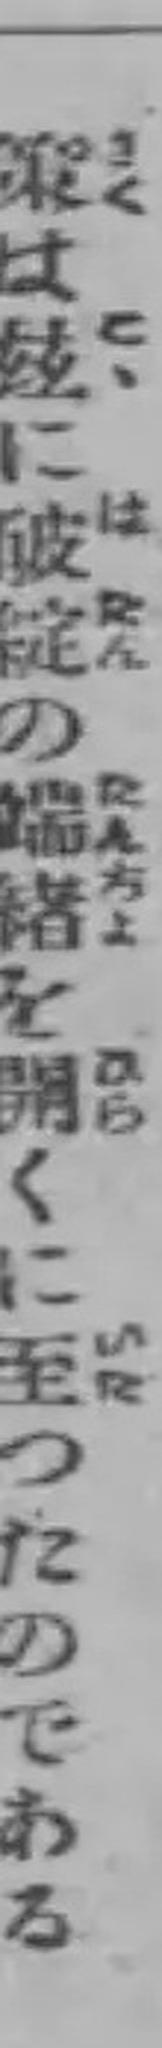策は茲に破綻の端緒を開くに至つたのである
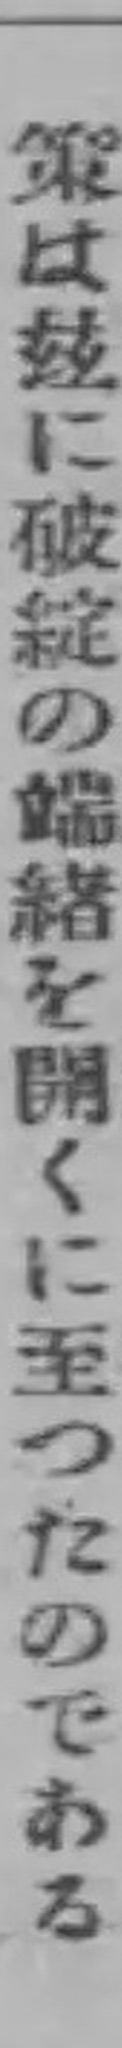策は茲に破綻の端緒を開くに至つたのである
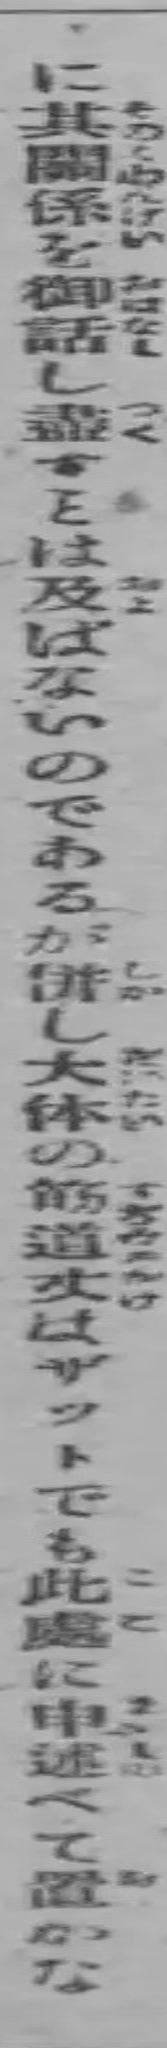に其関係を御話し尽すことは及ばないのであるが併し大体の筋道丈はザツトでも此処に申述べて置かな
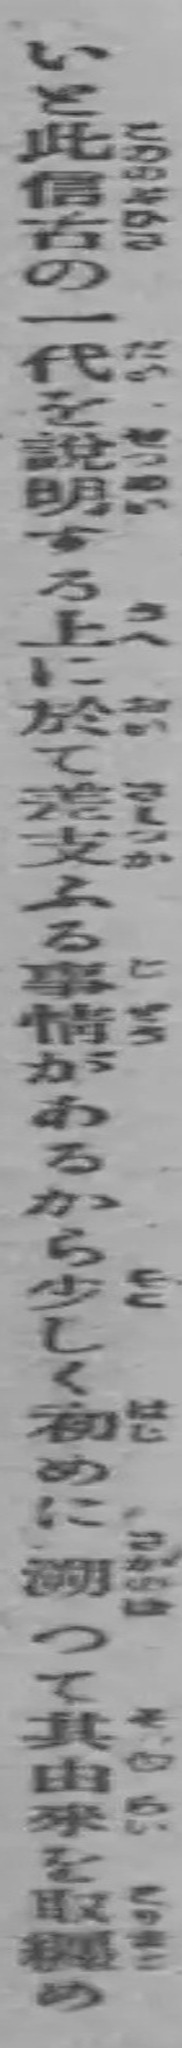いと此信古の一代を説明する上に於て差支ふる事情があるから少しく初めに遡つて其由来を取纏め

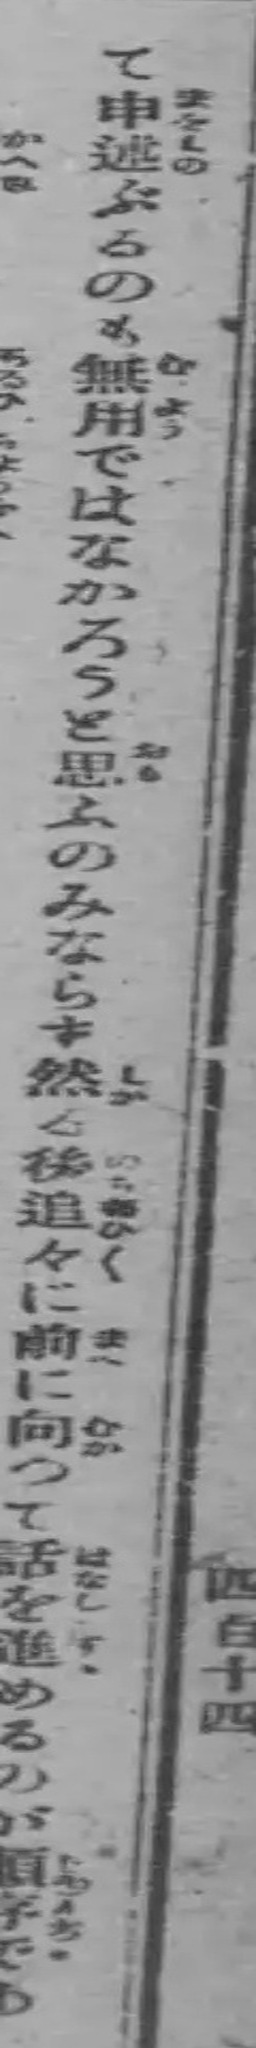て申述ぶるのも無用ではなかろうと思ふのみならず然る後追々に前に向つて話を進めるのが順序であ
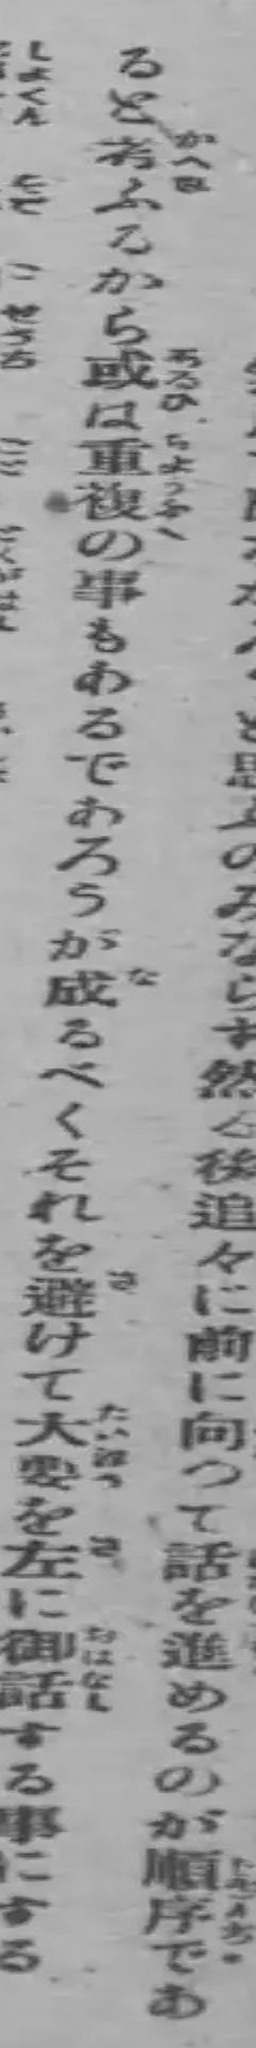ると考ふるから或は重複の事もあるであろうが成るべくそれを避けて大要を左に御話する事にする
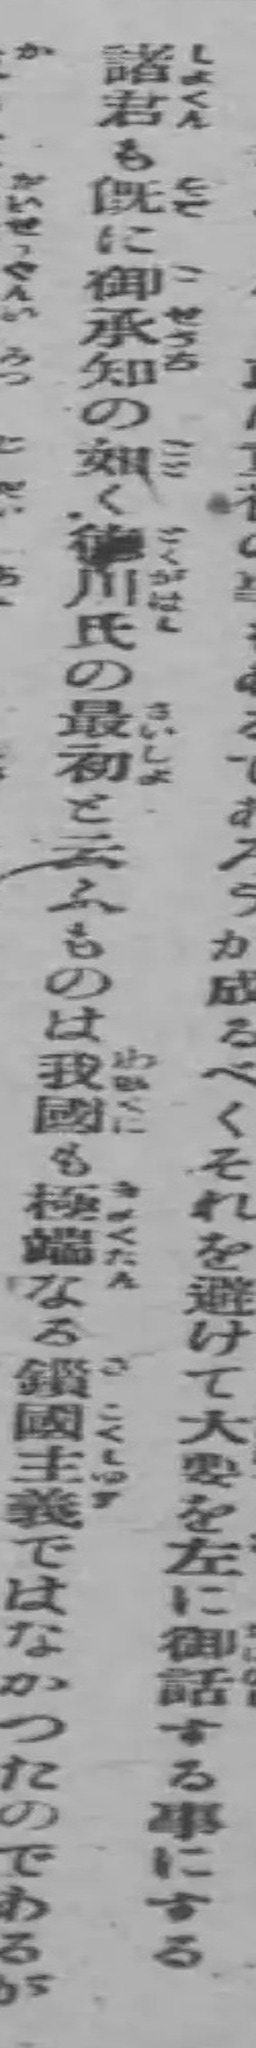諸君も既に御承知の如く徳川氏の最初と云ふものは我国も極端なる鎖国主義ではなかつたのであるが
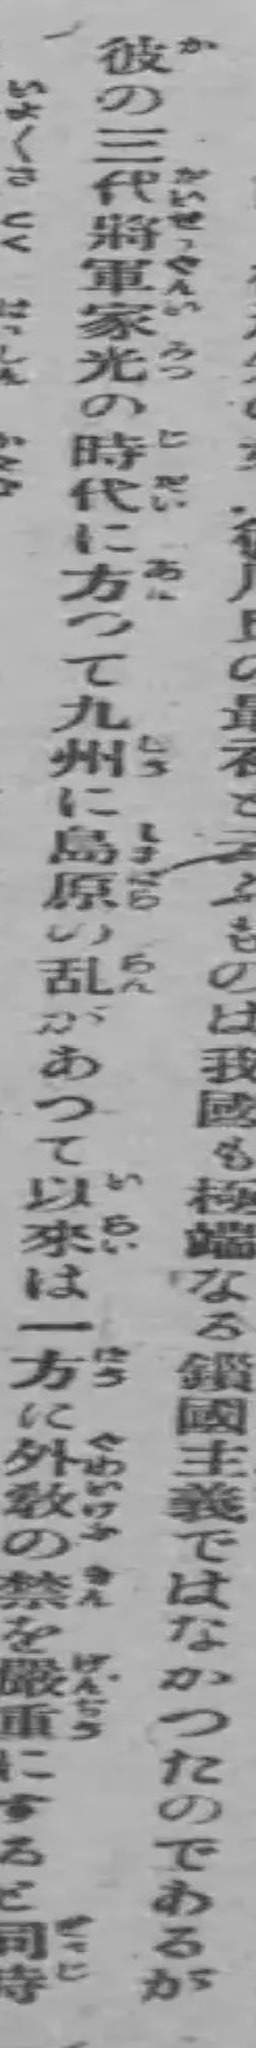彼の三代将軍家光の時代に方つて九州に島原の乱があつて以来は一方に外教の禁を厳重にすると同時
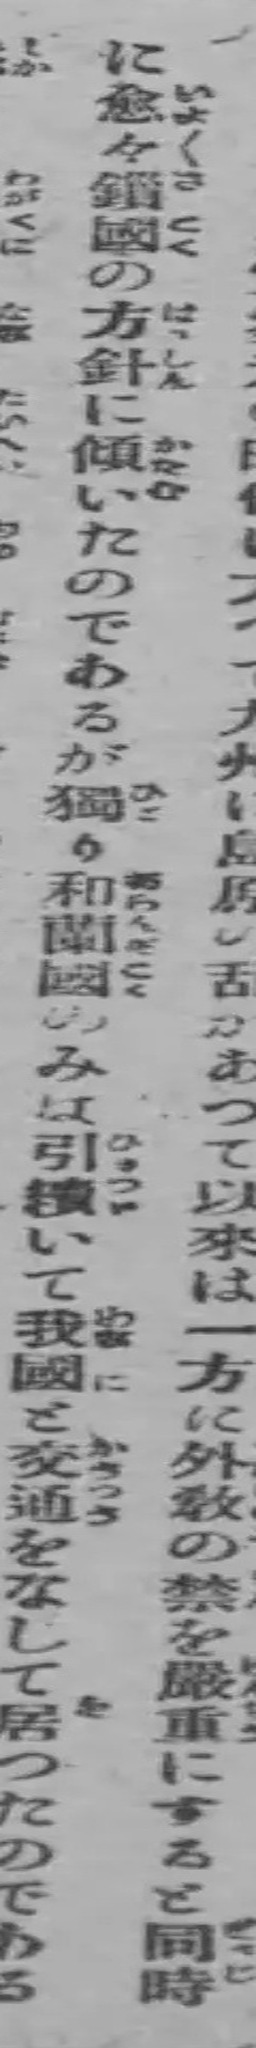に愈々鎖国の方針に傾いたのであるが独り和蘭国のみは引続いて我国と交通をなして居つたのである
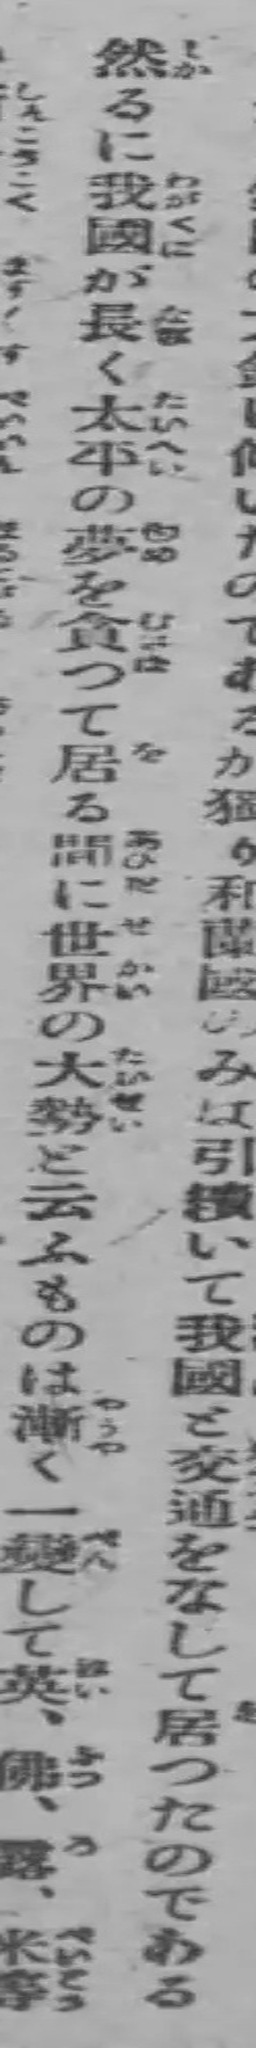然るに我国が長く太平の夢を貪つて居る間に世界の大勢と云ふものは漸く一変して英、仏、露、米等
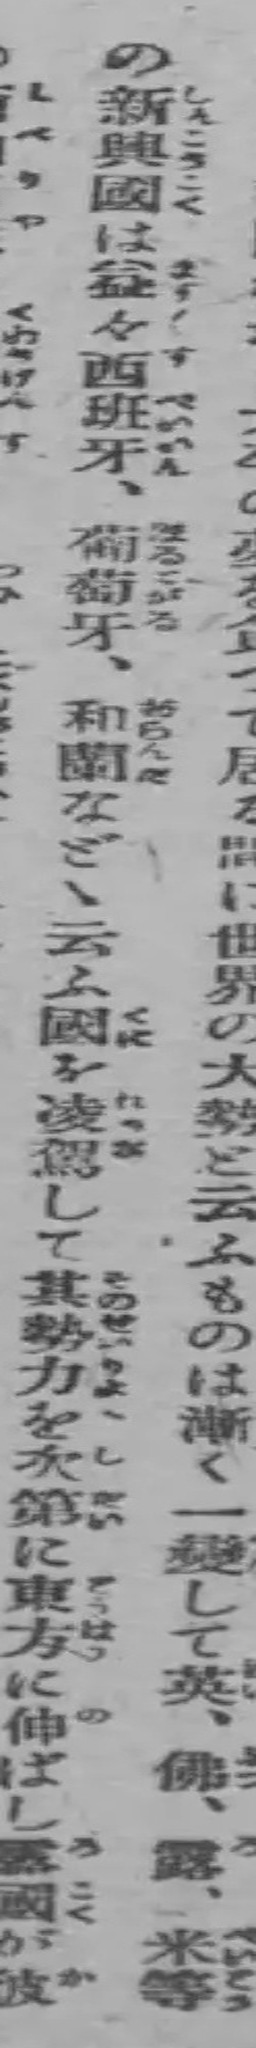の新興国は益々西班牙、葡萄牙、和蘭などゝ云ふ国を凌駕して其勢力を次第に東方に伸ばし露国が彼
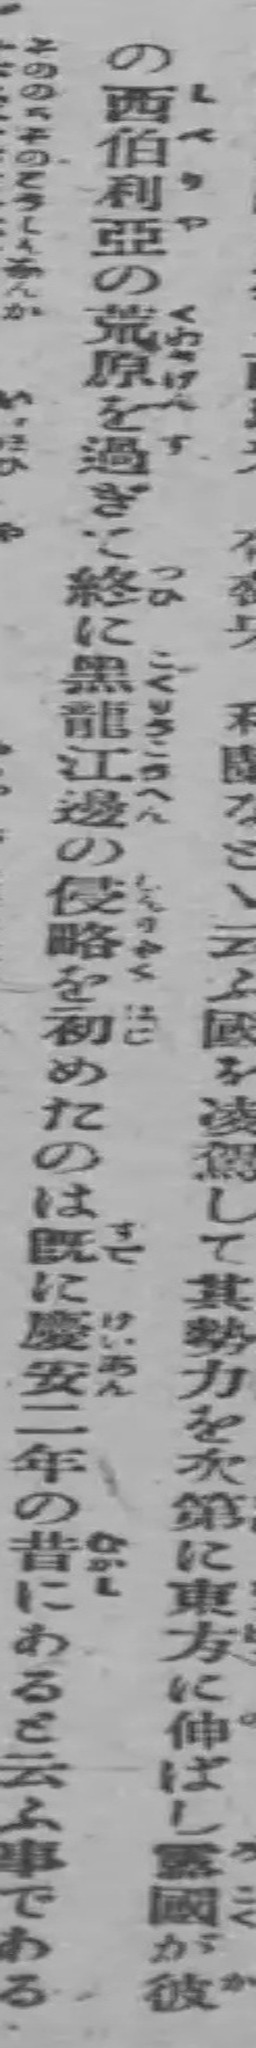の西伯利亜の荒原を過ぎて終に黒龍江辺の侵略を初めたのは既に慶安二年の昔にあると云ふ事である
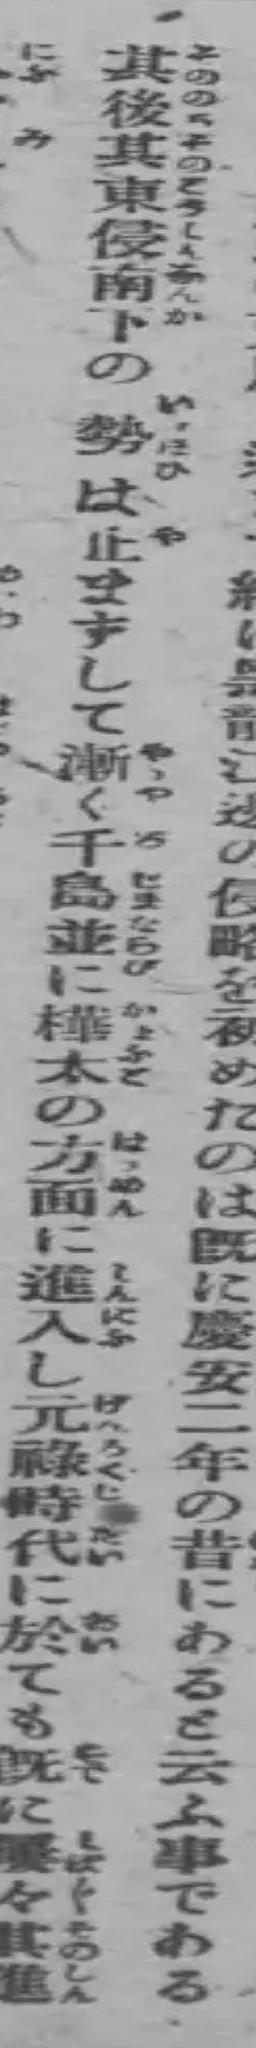其後其東侵南下の勢は止まずして漸く千島並に樺太の方面に進入し元禄時代に於ても既に屡々其進
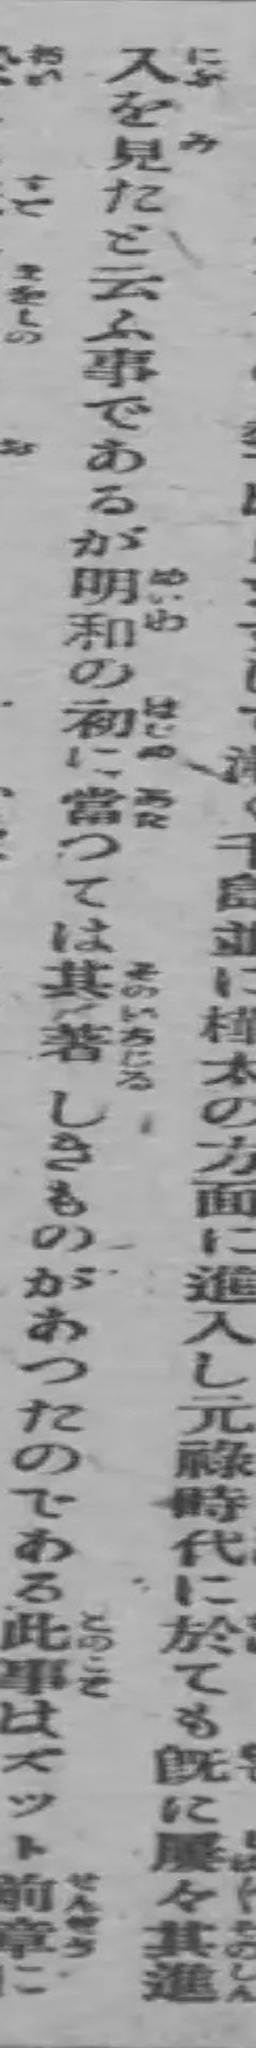入を見たと云ふ事であるが明和の初に当つては其著しきものがあつたのである此事はズツト前章に
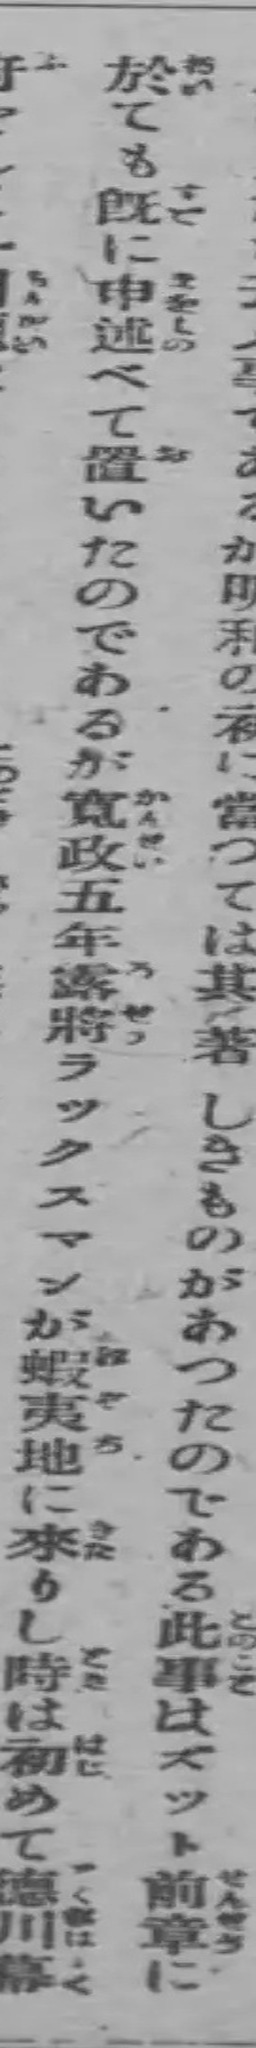於ても既に申述べて置いたのであるが寛政五年露将ラツクスマンが蝦夷地に来りし時は初めて徳川幕
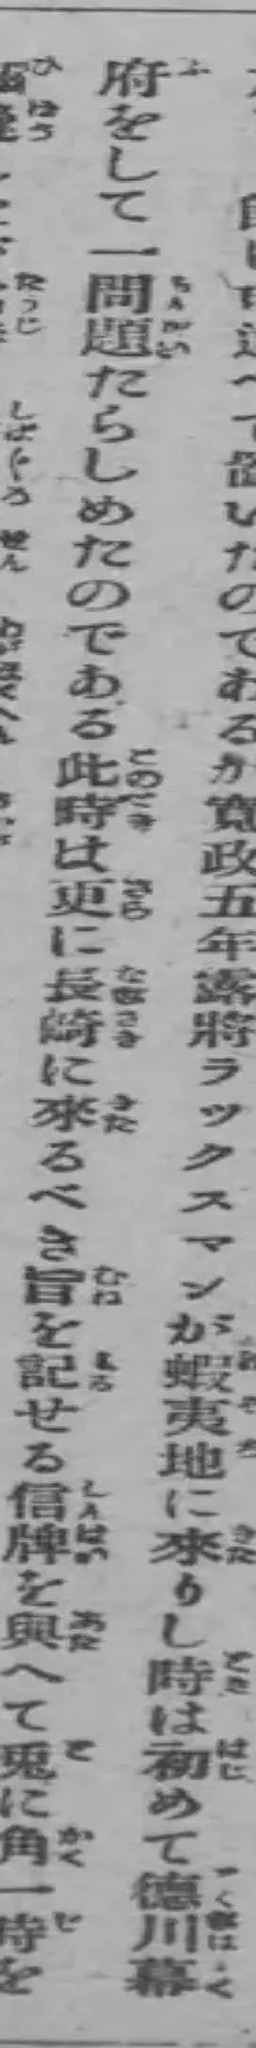府をして一問題たらしめたのである此時は更に長崎に来るべき旨を記せる信牌を与へて兎に角一時を
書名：豊橋市史談
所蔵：国立国会図書館 National Diet Library, JAPAN
